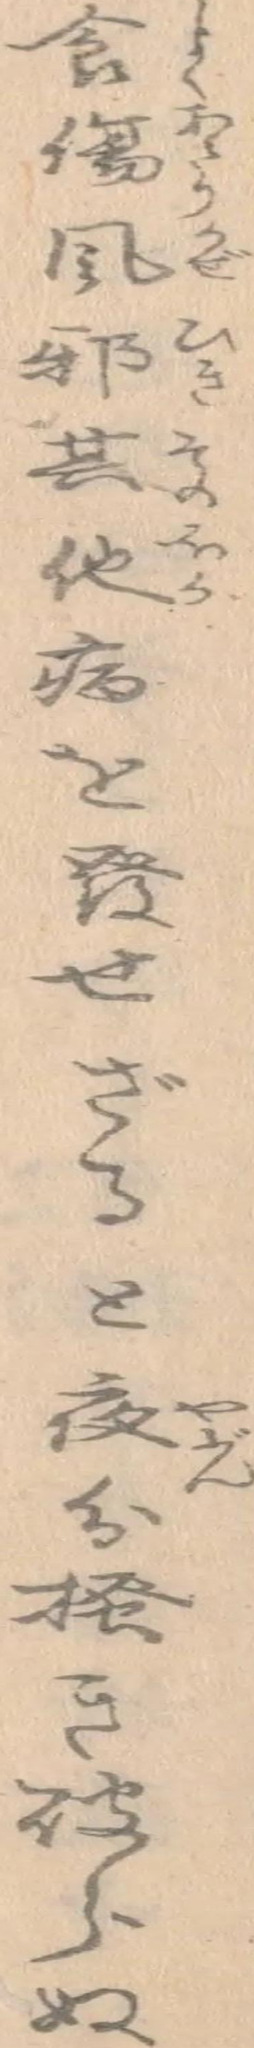食傷風邪其他を発せざると夜分掻き破らぬ
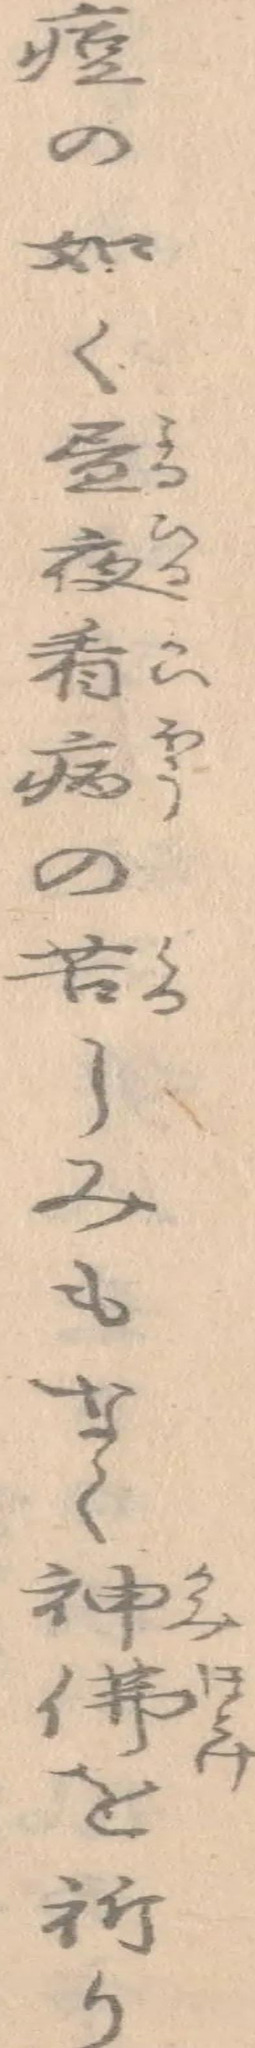痘の如く昼夜看病の苦しみもなく神佛を祈り
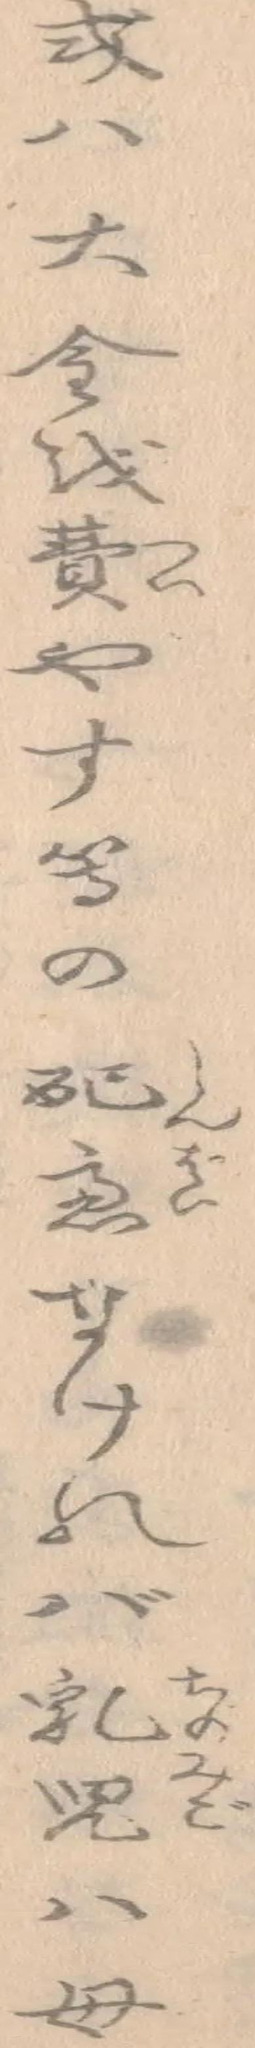或は大金を費やす等の配慮なければ乳児は母
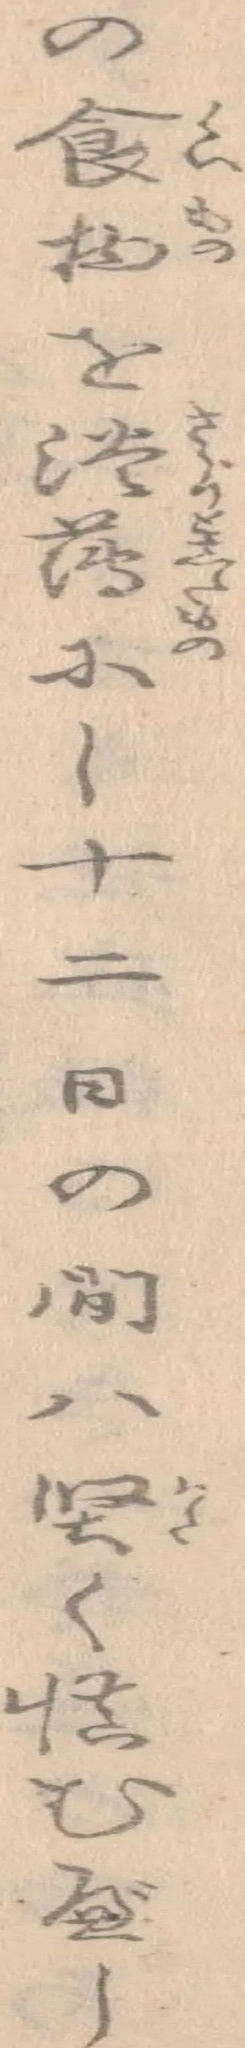の食物を淡簿にし十二日の間は堅く慎むべし
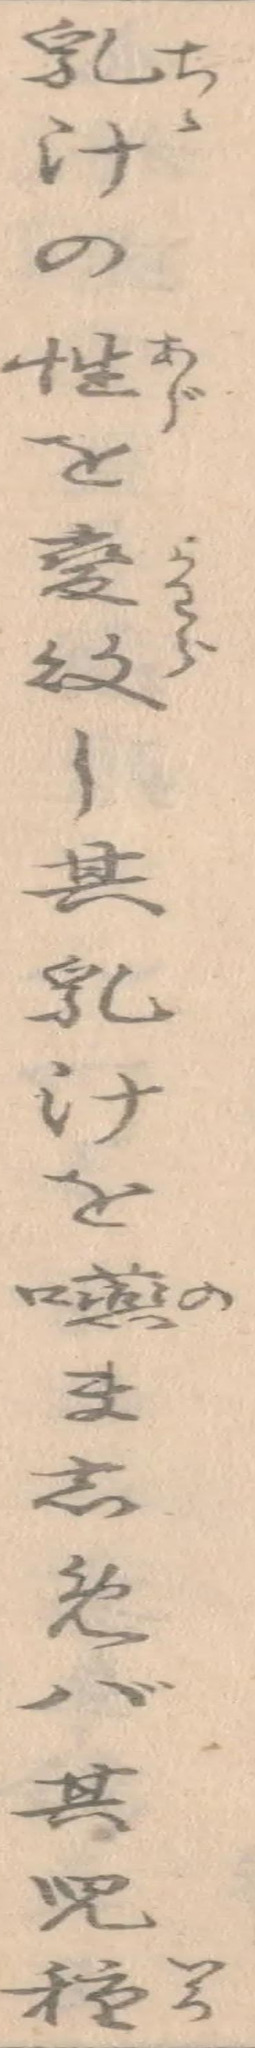乳汁の性を変紋し其乳汁を嚥ましめば其児種
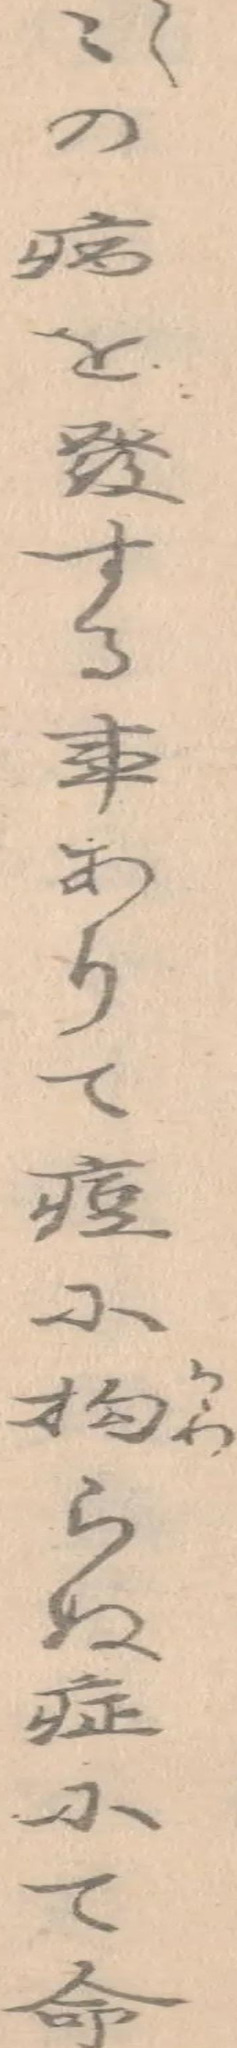引の病を発する事ありて痘に拘なぬ症にて命
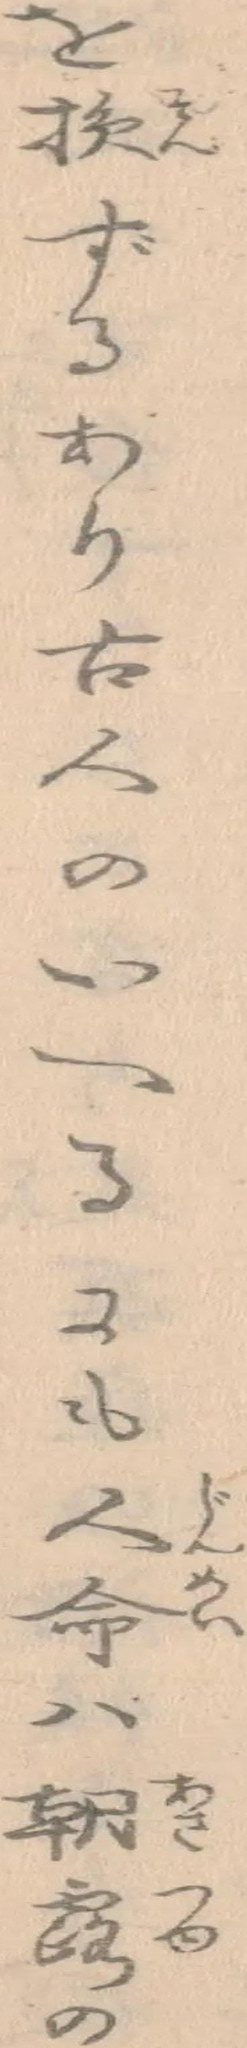を検ずるあり古人のいへるにも人命は朝露の
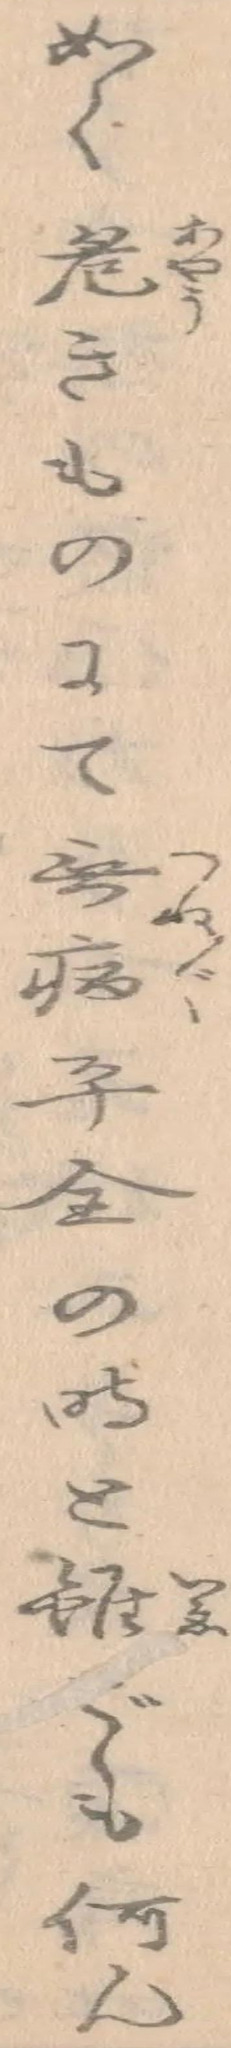如く危きものにて無病平全の時と雖ども何ん
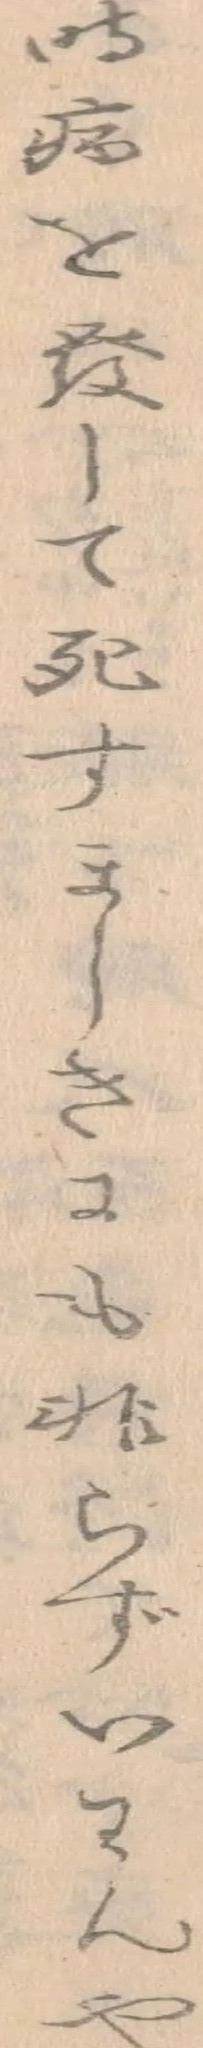時病を発して死すましきにも非らずいわんや
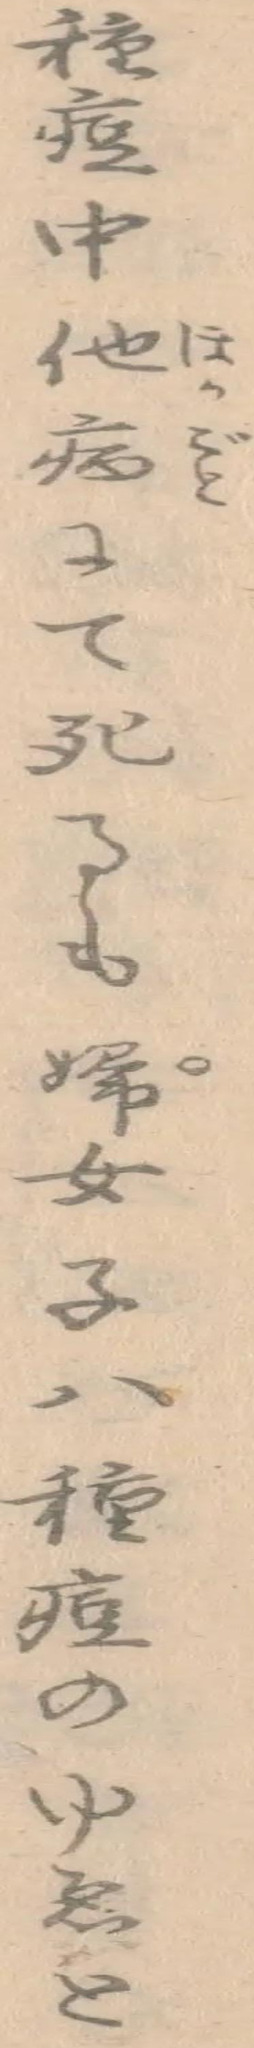種痘中他病にて死るも婦女子は種痘のゆゑと
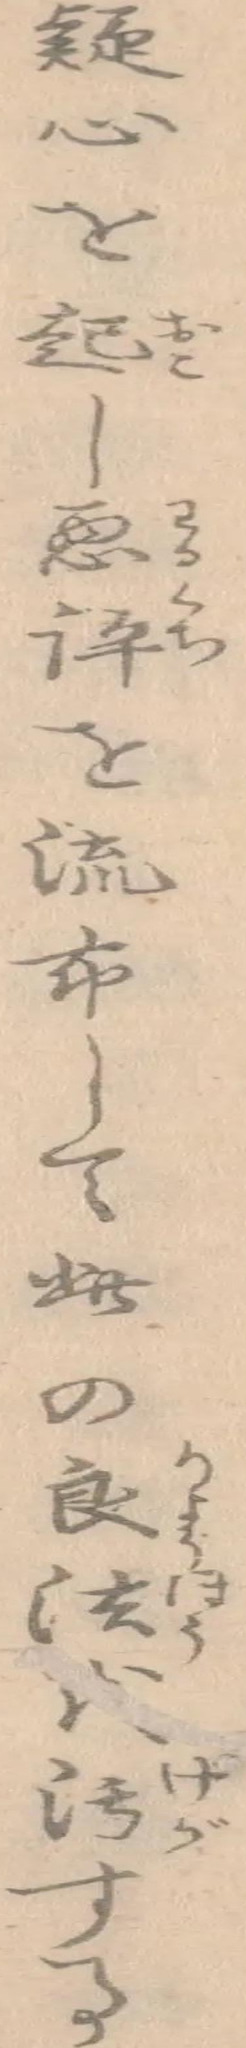疑心を起し悪評を流布して此の良法を汚す事
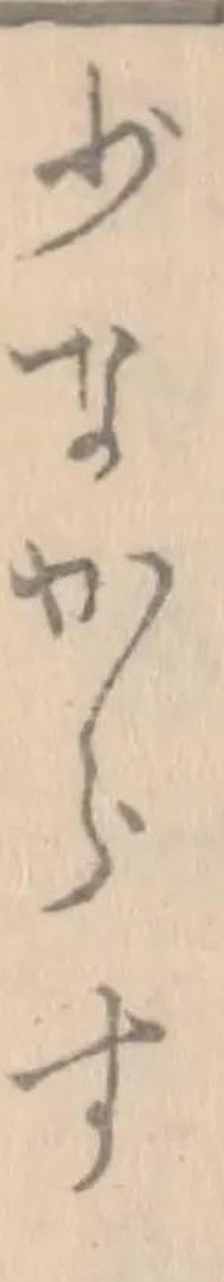少なからす
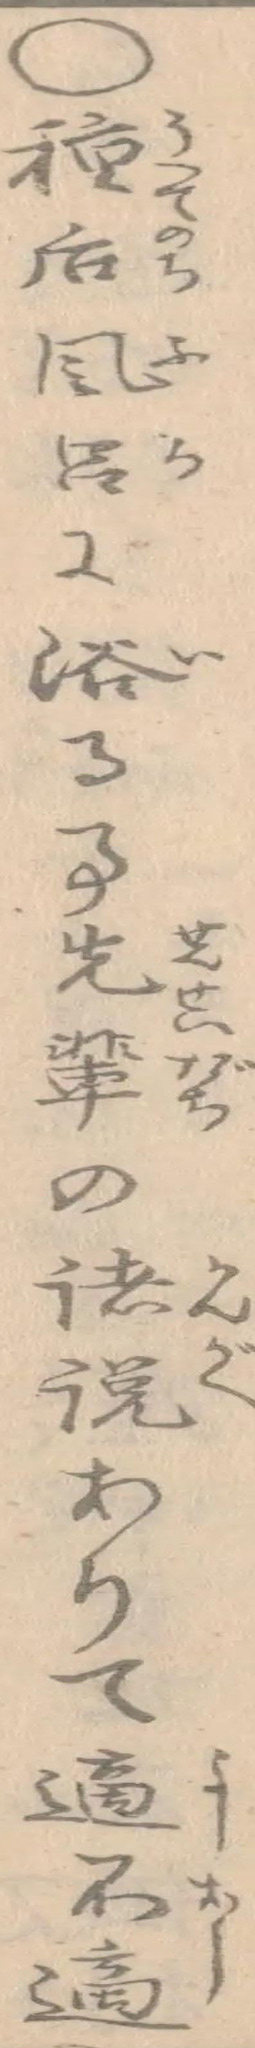○種后風呂に浴る事先輩の法悦ありて適不適
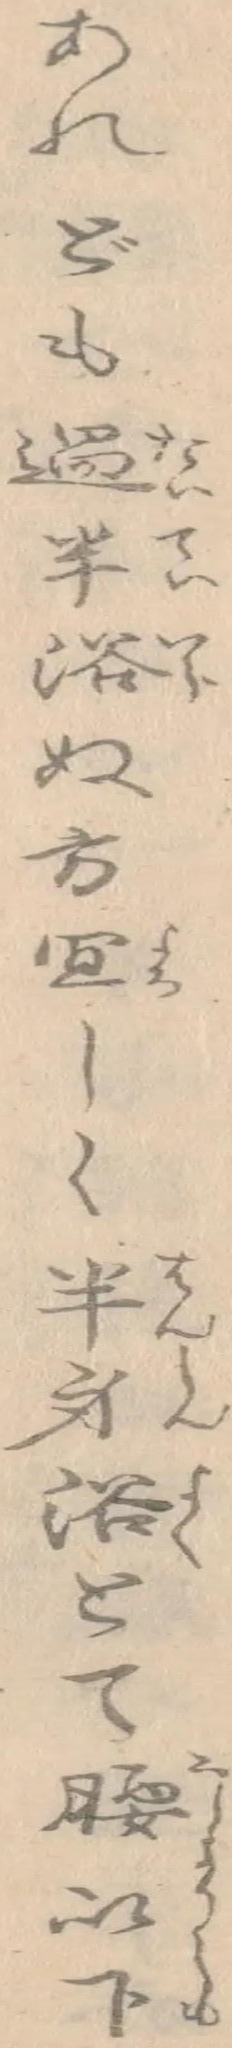あれども過半浴ぬ方宜しく半身浴とて腰以下
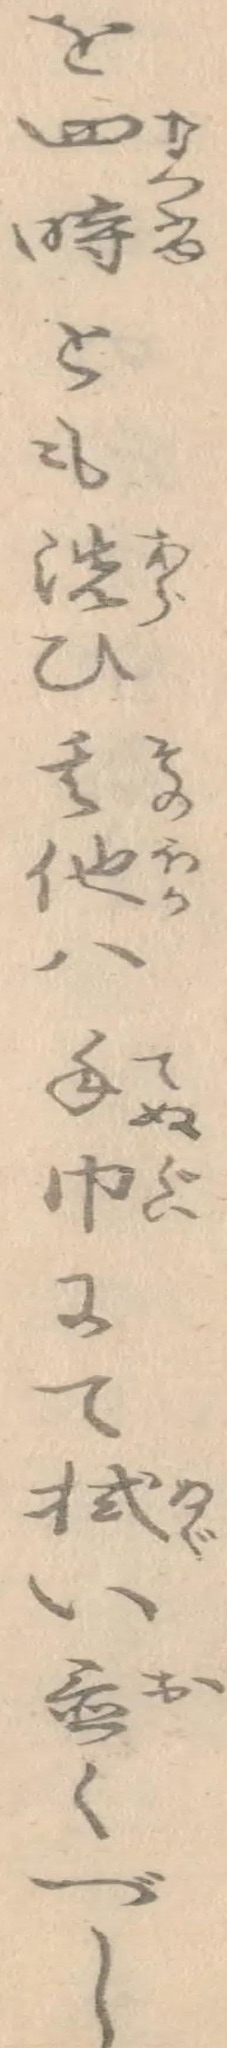を四時とも洗ひ其他は手巾にて拭い置くべし
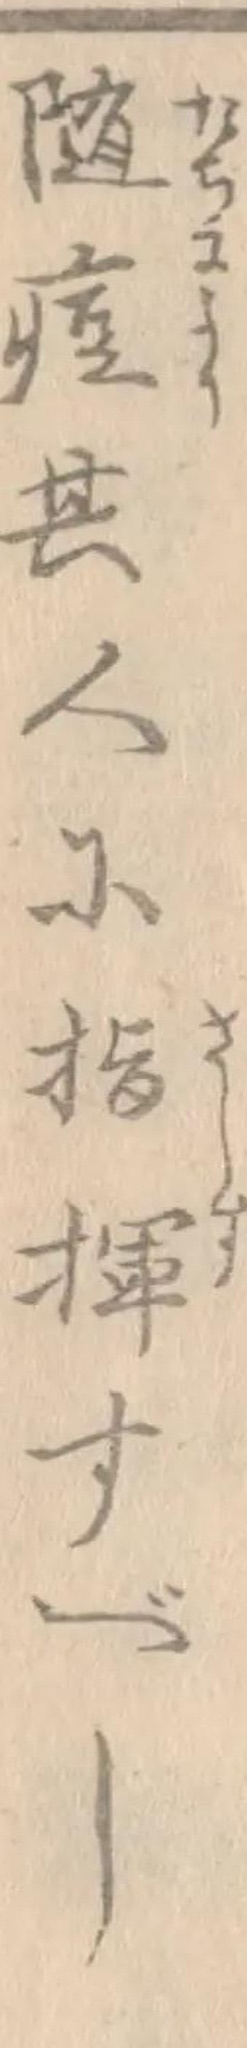随痘其人に指揮すべし
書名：散花養生訓
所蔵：国立国会図書館 National Diet Library, JAPAN
